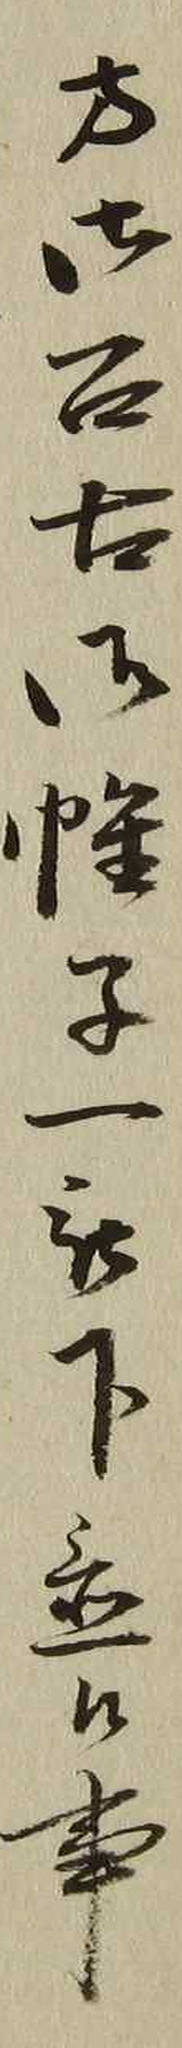方御召古御帷子一被下置候事
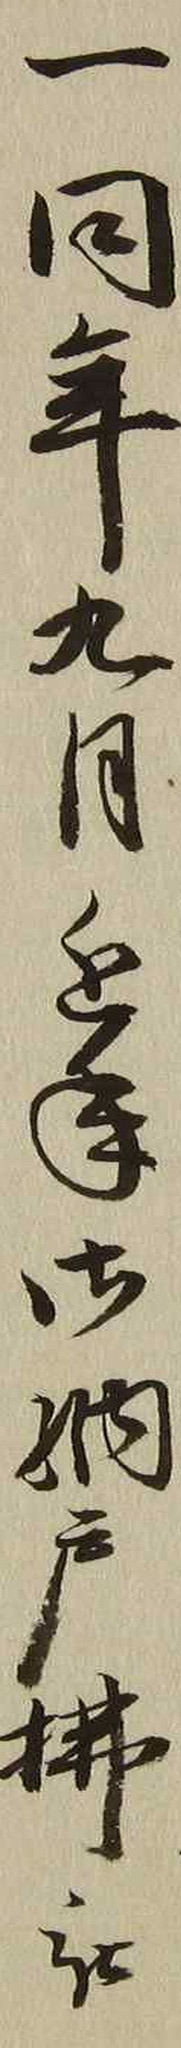一同年九月近年御納戸払被
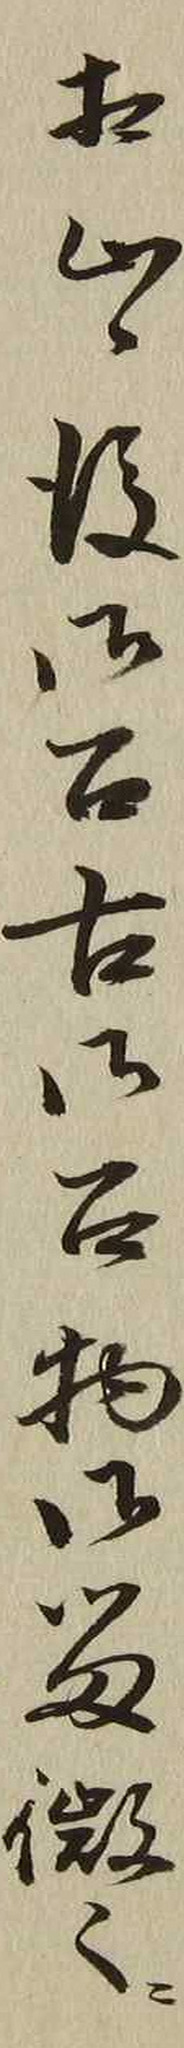相止候後御召古御召物御留微々ニ
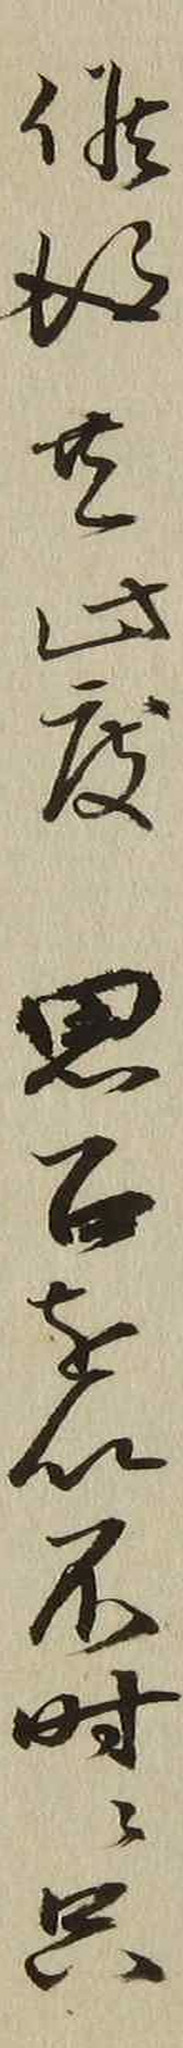候得共此度思召を以不時ニ只
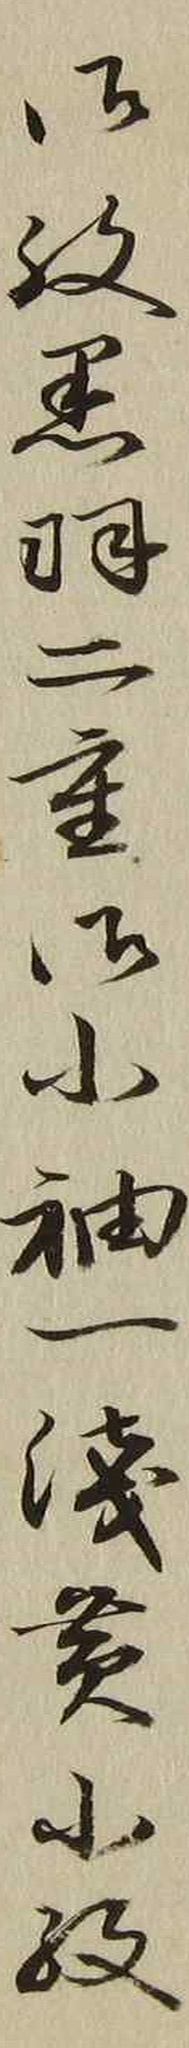御紋黒羽二重御小袖一浅黄小紋
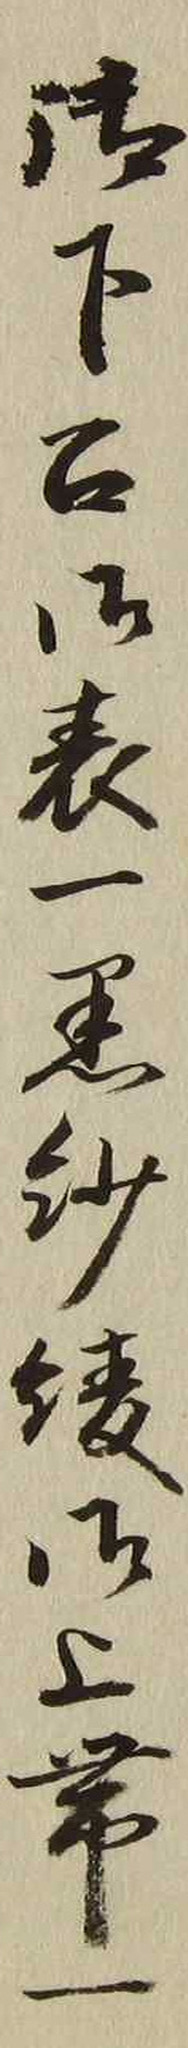御下召御表一黒紗綾御上帯一
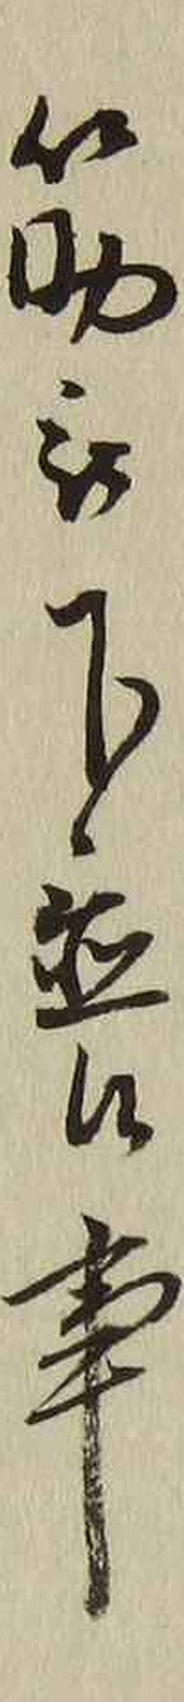筋被下置候事
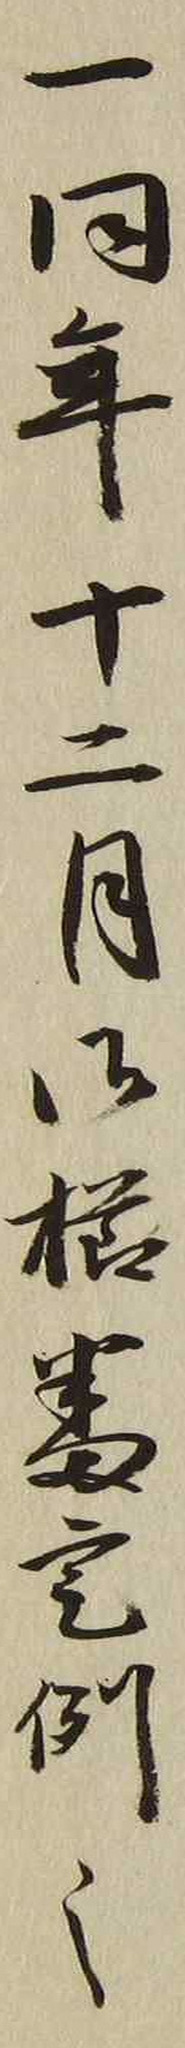一同年十二月御櫛番定例之
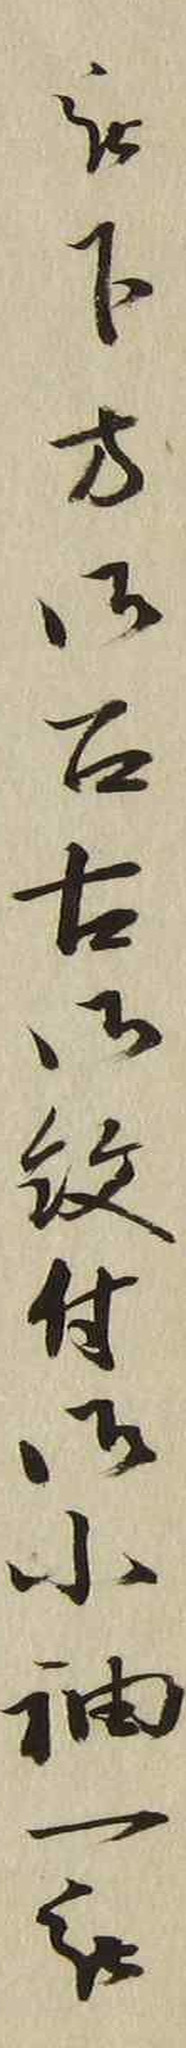被下方御召古御紋付御小袖一被
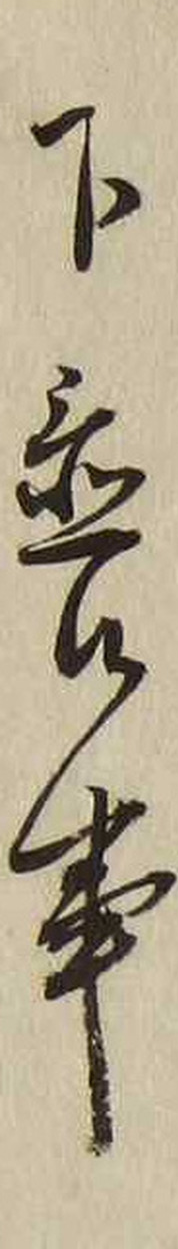下置候事

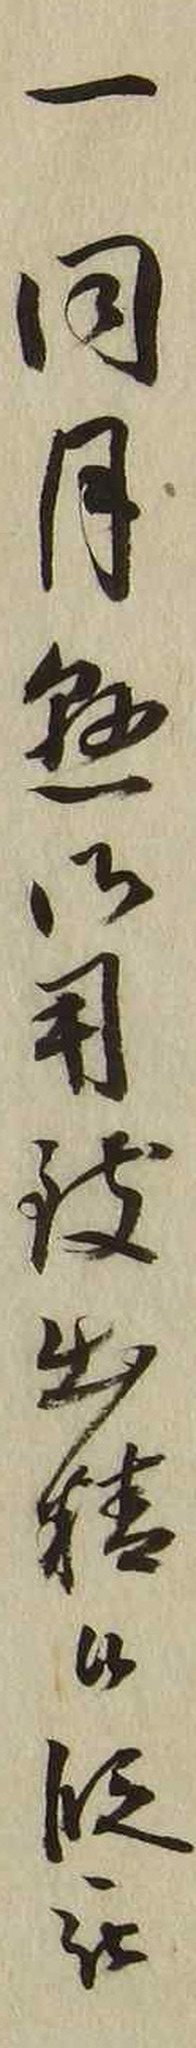一同月懸御用致出精候段被
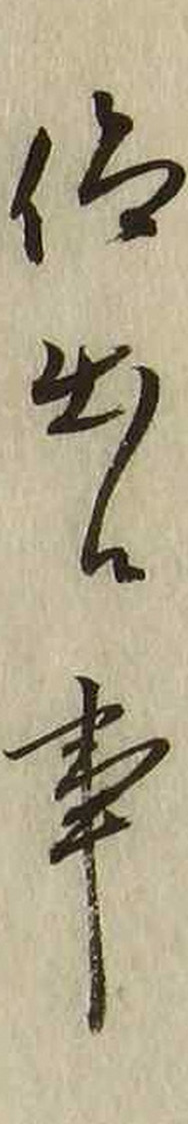仰出候事
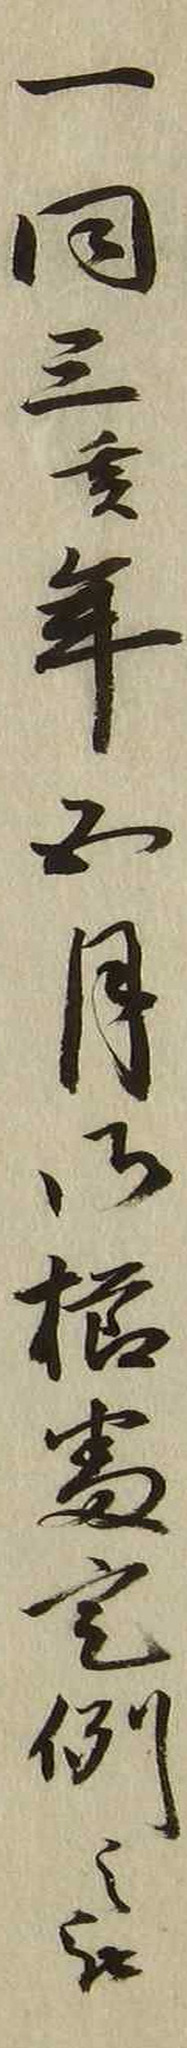一同三亥年五月御櫛番定例之被
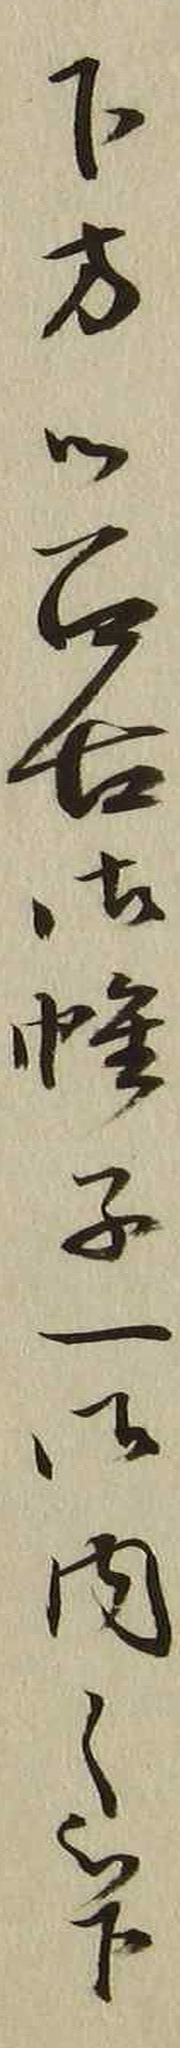下方候召古御帷子一御内々被下
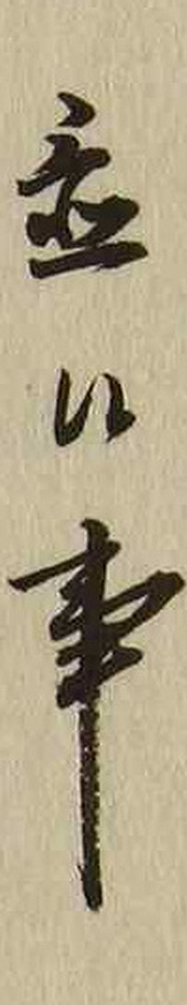置候事
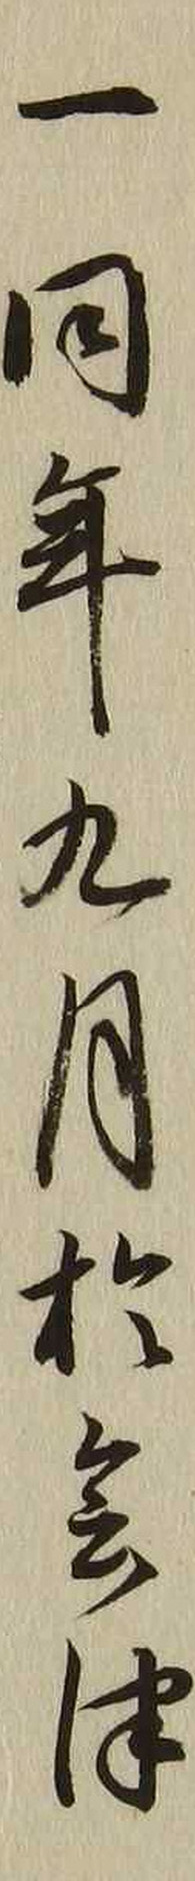一同年九月於会津
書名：諸士系譜　巻之61　と之部4
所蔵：会津若松市立会津図書館
